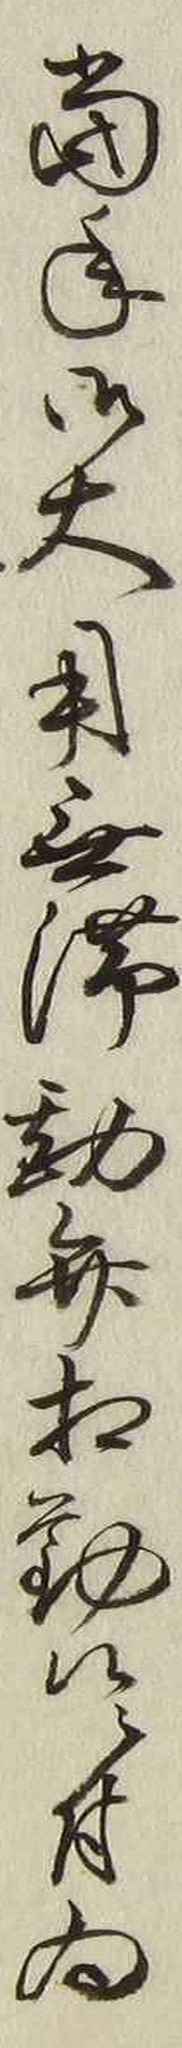当年御大用無滞勘弁相勤候ニ付為
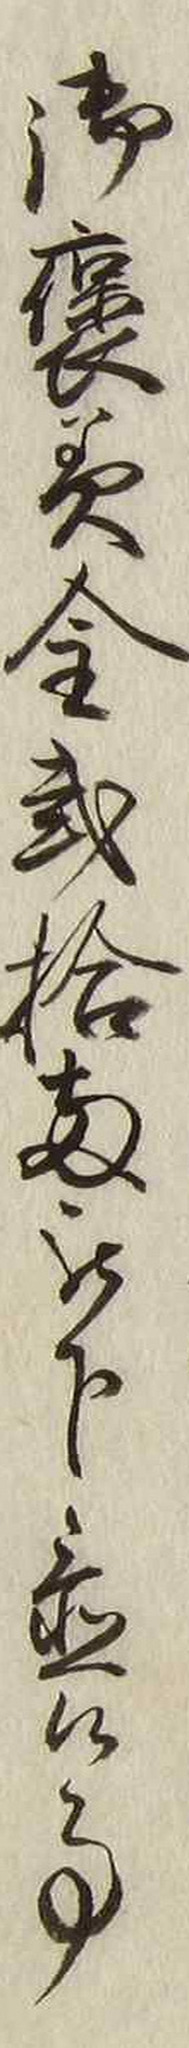御褒美金弐拾両被下置候事
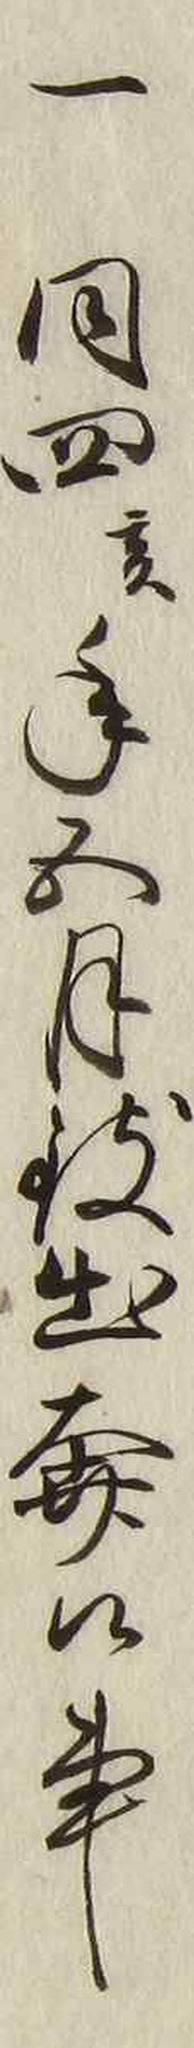一同四亥年五月致出奔候事
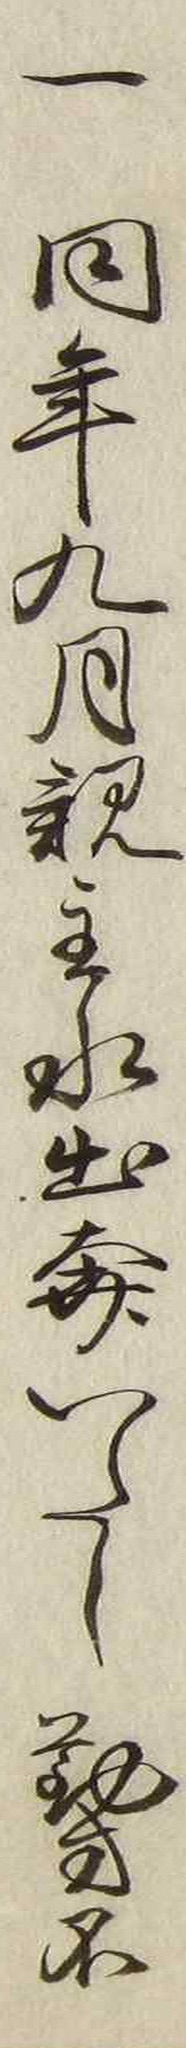一同年九月親主水出奔いたし勤方不

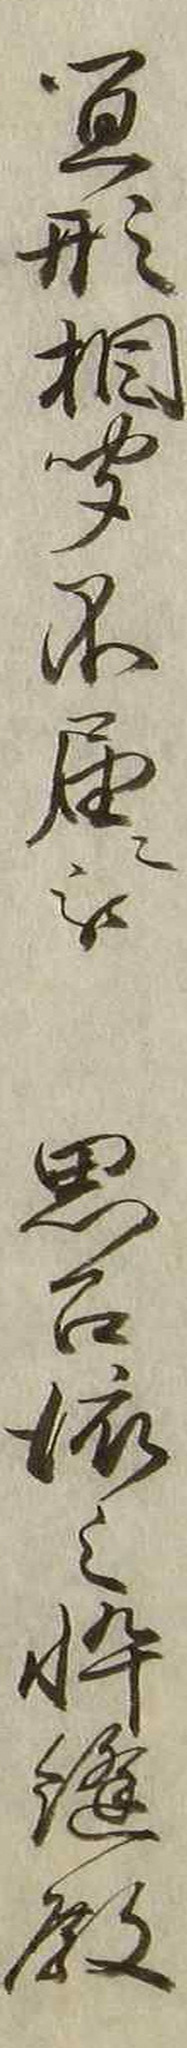宜形相聞不届ニ被思召依之忰縫殿
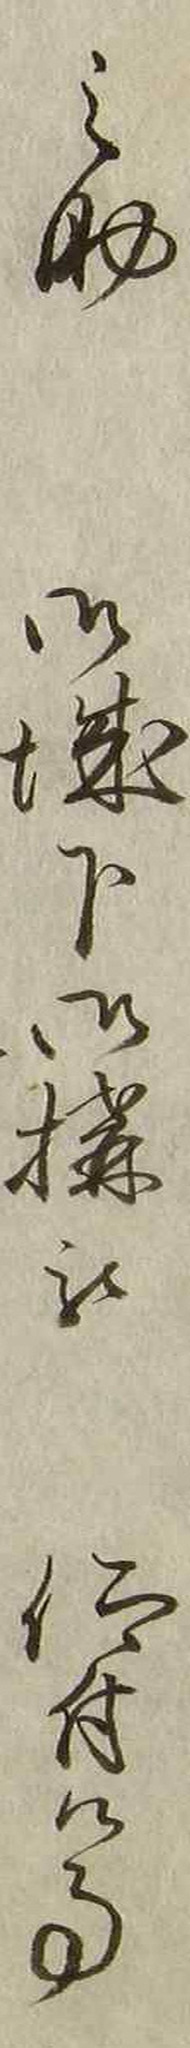之助御城下御構被仰付候事
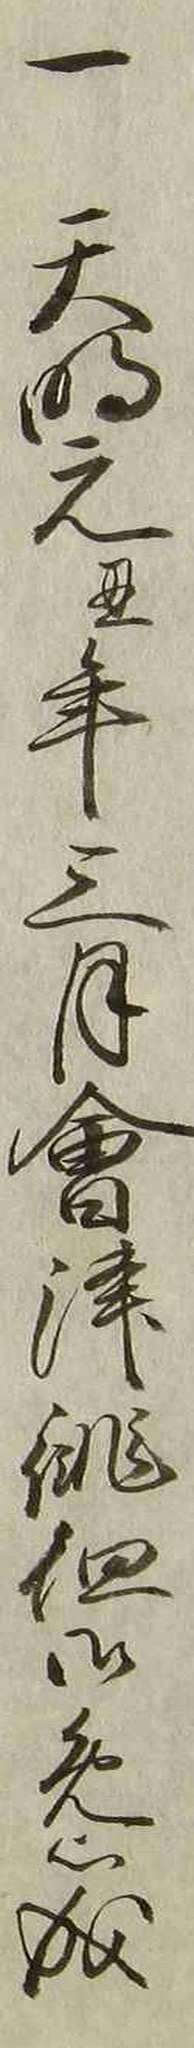一天明元丑年三月会津徘徊御免被成
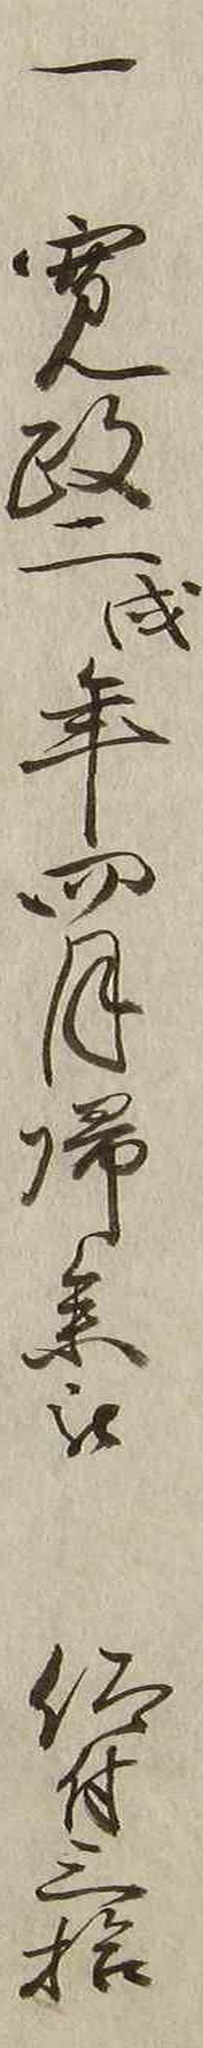一寛政二戌年四月帰参被仰付三拾
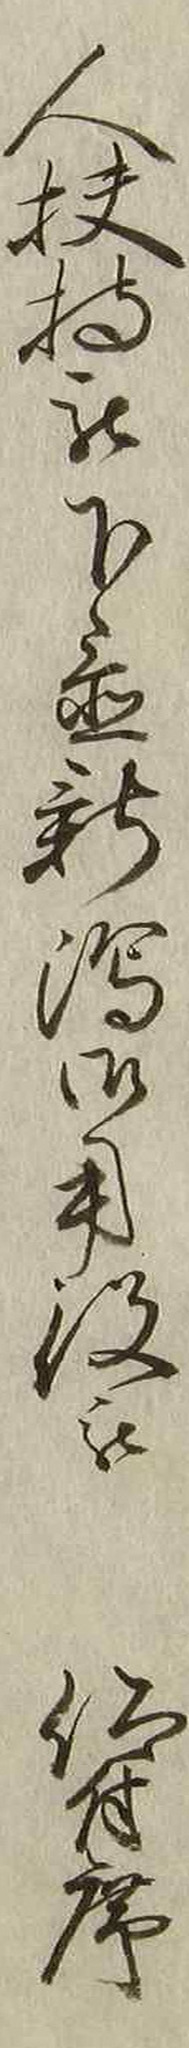人扶持被下置新潟御用役被仰付席
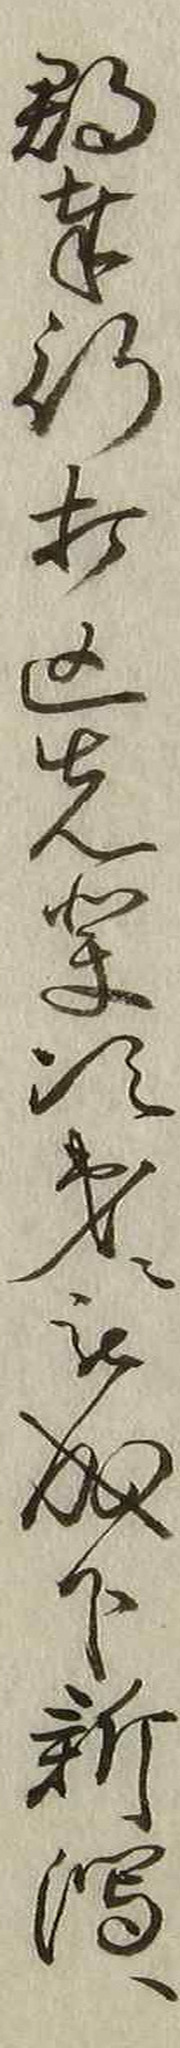郡奉行打込先輩次第ニ被成下新潟へ
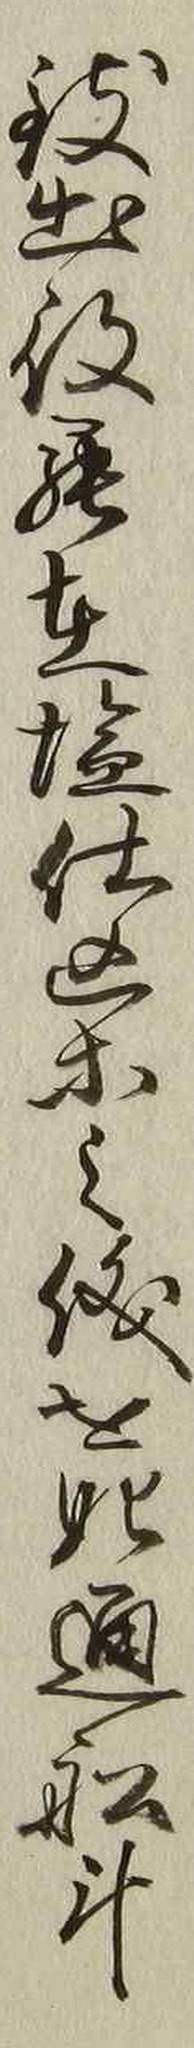致出役罷在塩仕込等之儀を始通船斗
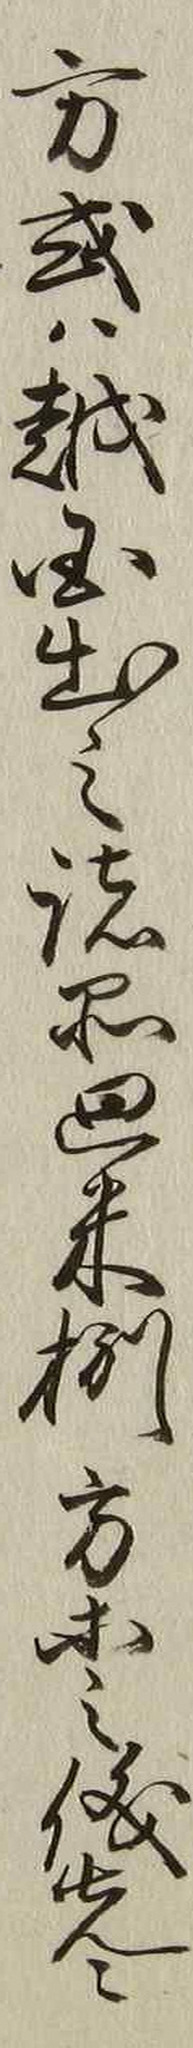方或ハ越国出之諸品廻米捌方等之儀先々
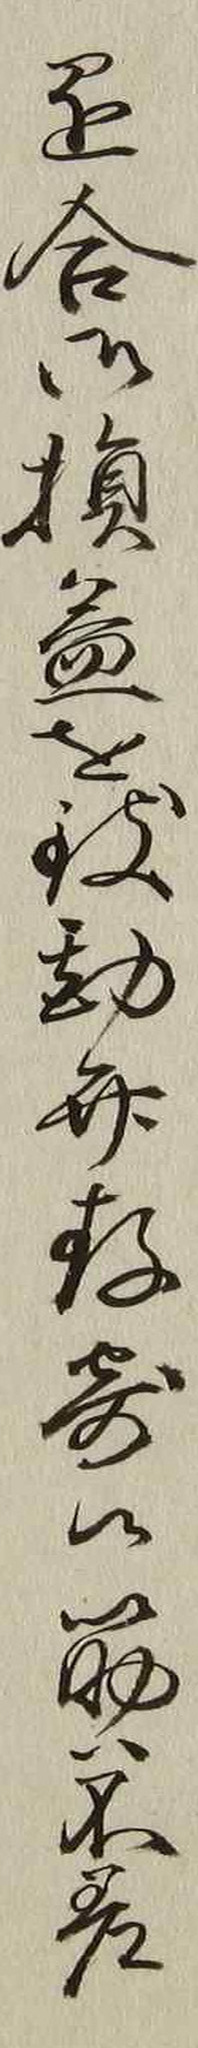懸合御損益を致勘弁存寄候筋ハ不差
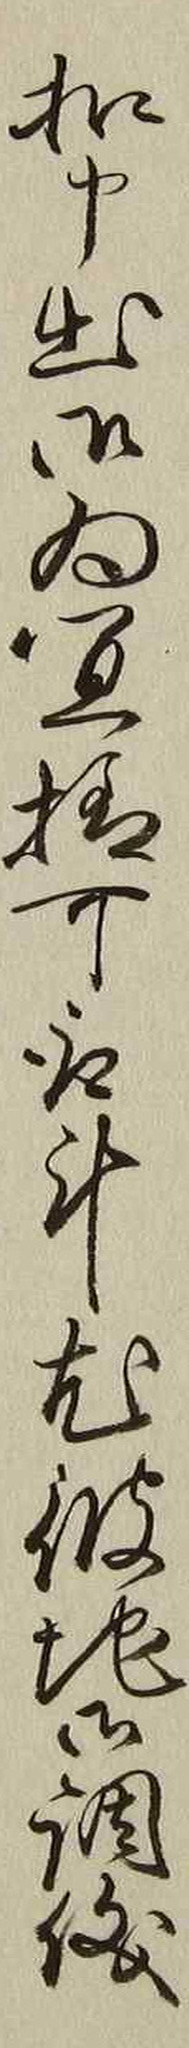控申出御為宜様可取計尤彼地御調儀
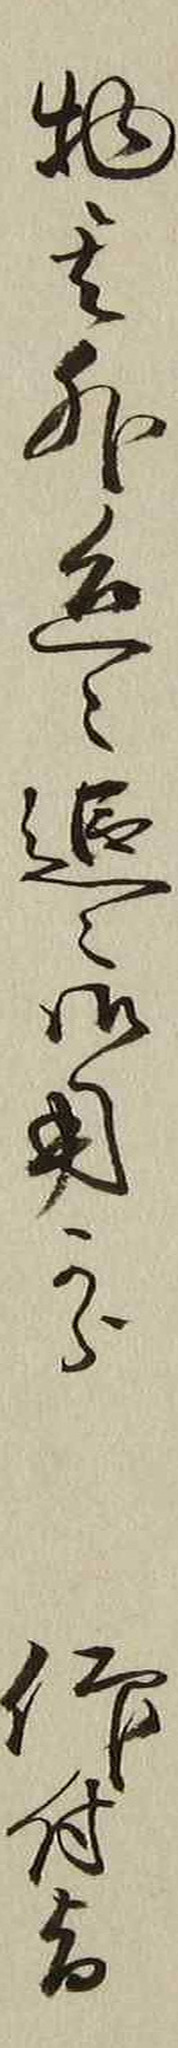物其外色々追々御用可被仰付旨
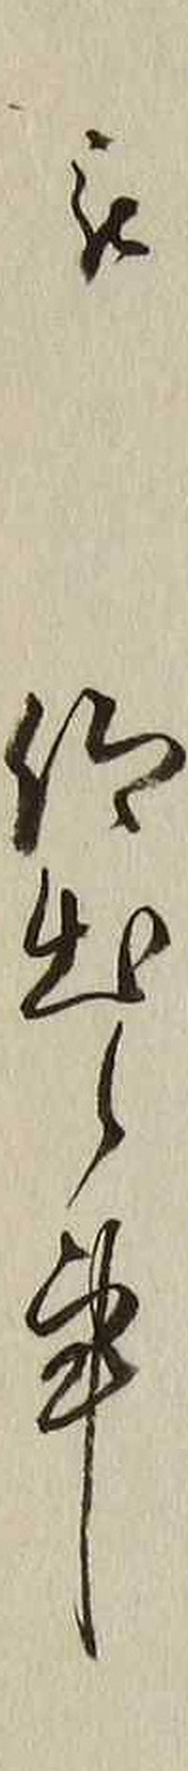被仰出候事
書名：諸士系譜　巻之21　い之部21
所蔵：会津若松市立会津図書館
